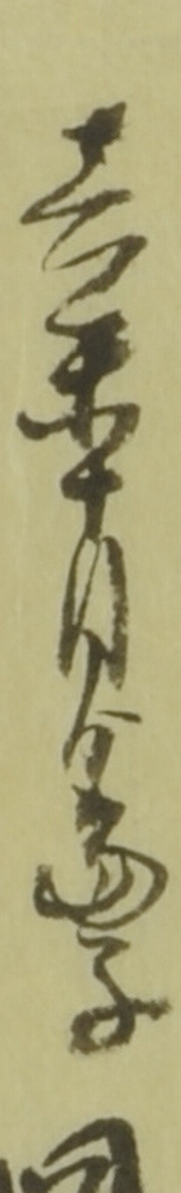去未十月ゟ当子
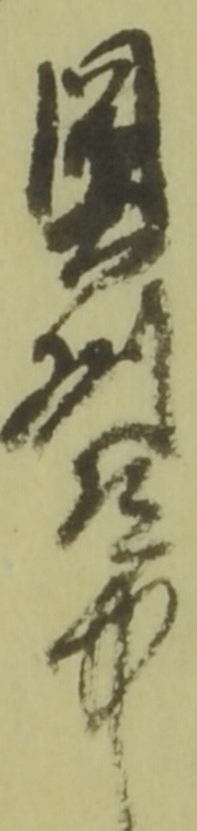甲州道中
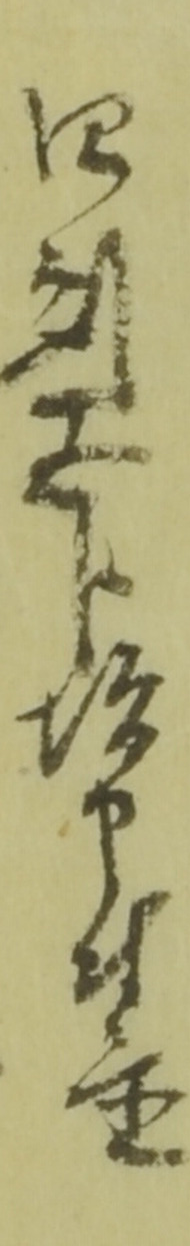四割五分増申付置
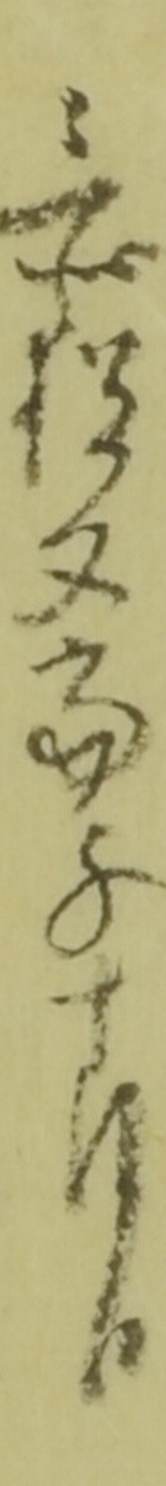候所猶又当子十月ゟ
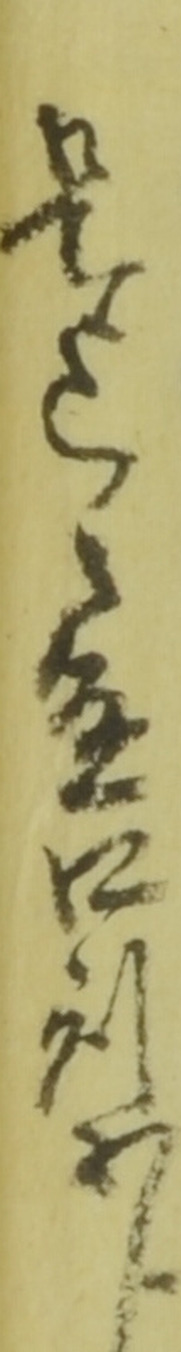是迄之通四割五分
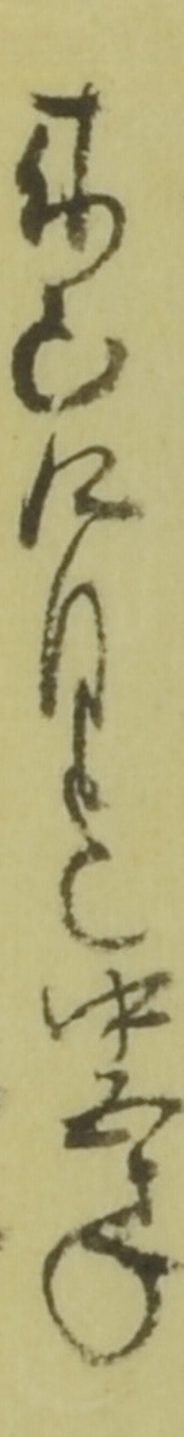来巳四月迄中五ヶ年
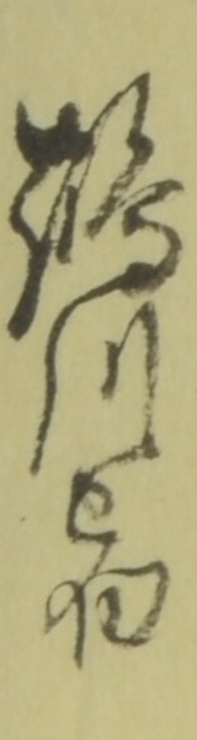贄川宿

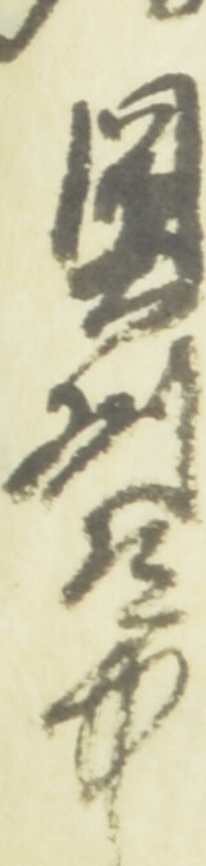甲州道中
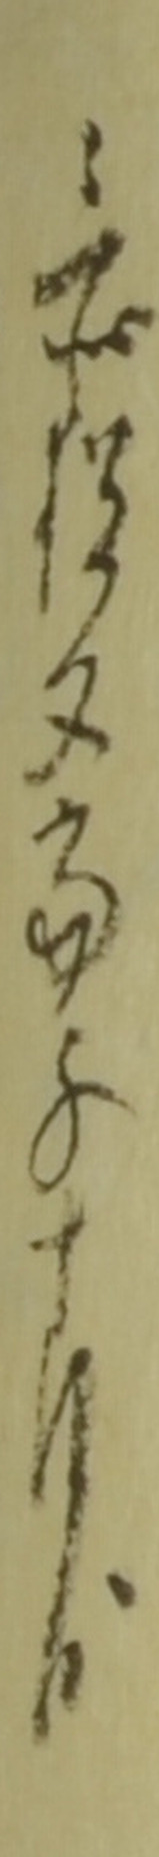候所猶又当子十月ゟ
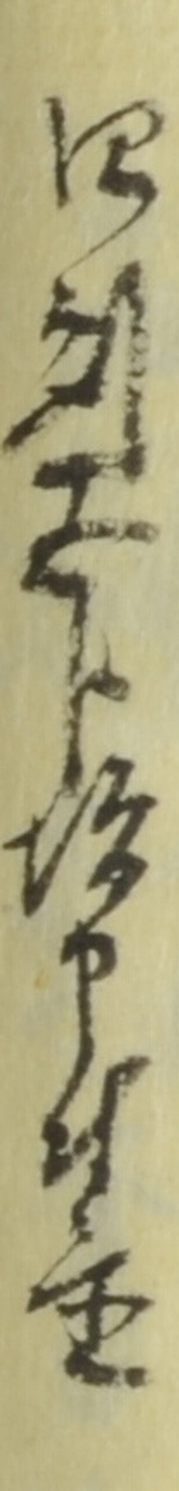四割五分増申付置
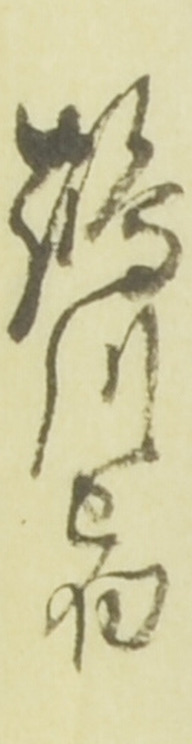鶴川宿
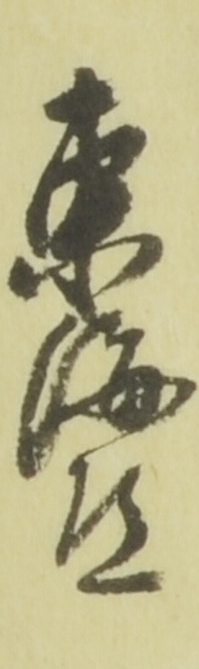東海道
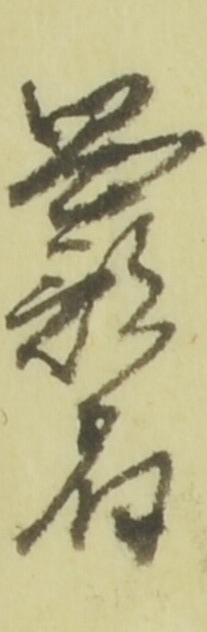岡部宿
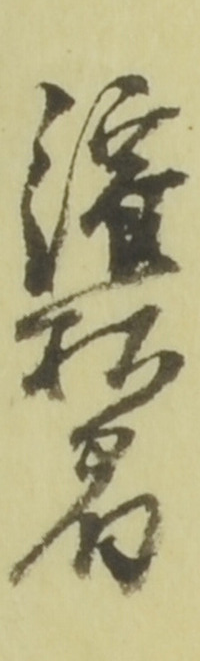浜松宿
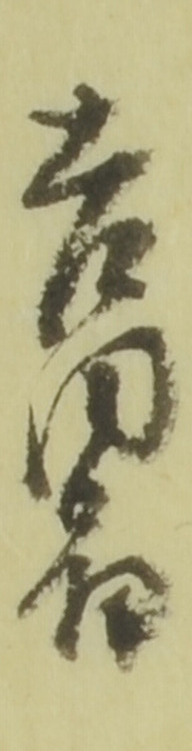吉田宿
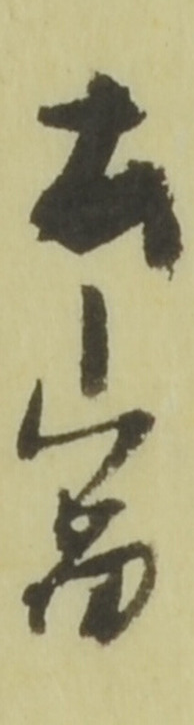土山宿
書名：御触書御書附控
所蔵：伊那市立高遠町図書館・合同会社AMANE
